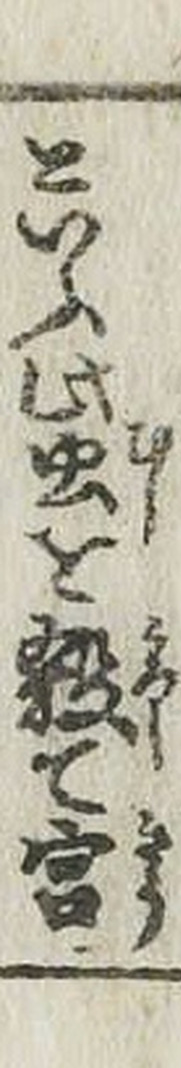といふ此虫を殺て宮
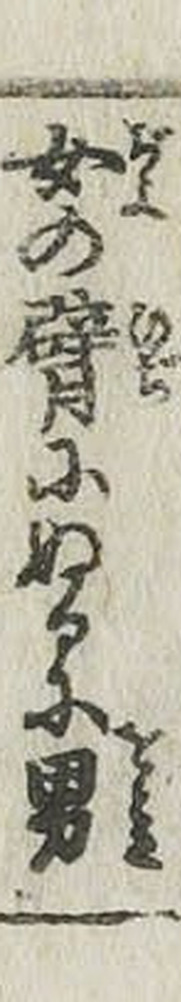女の臂にぬるに男
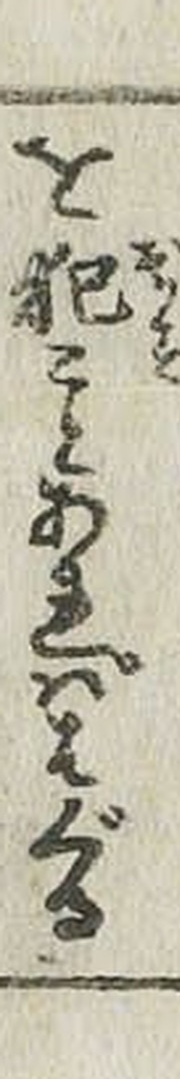を犯ことあればはぐる
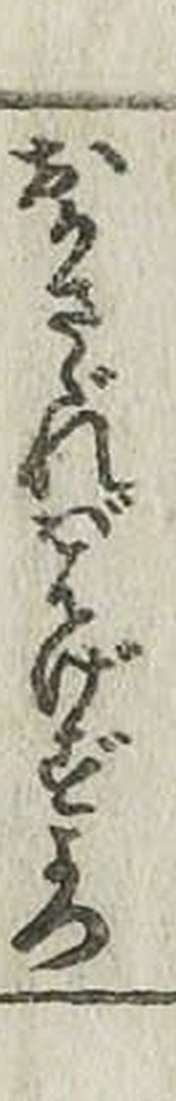おかさゞればはげずよつ
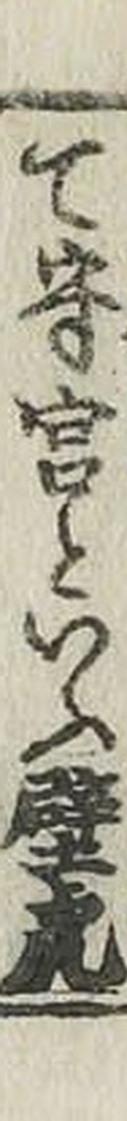て守宮といふ壁虎
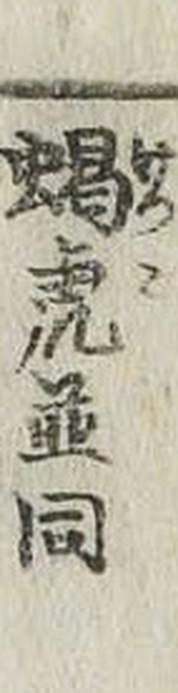蝎虎並同
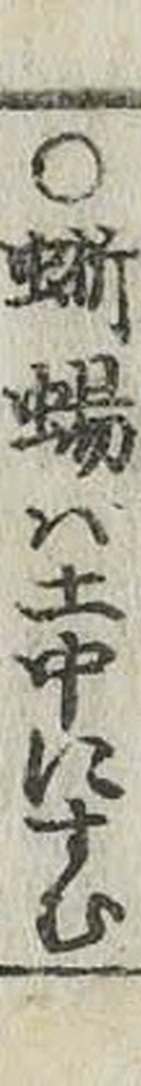○蜥蜴は土中にすむ
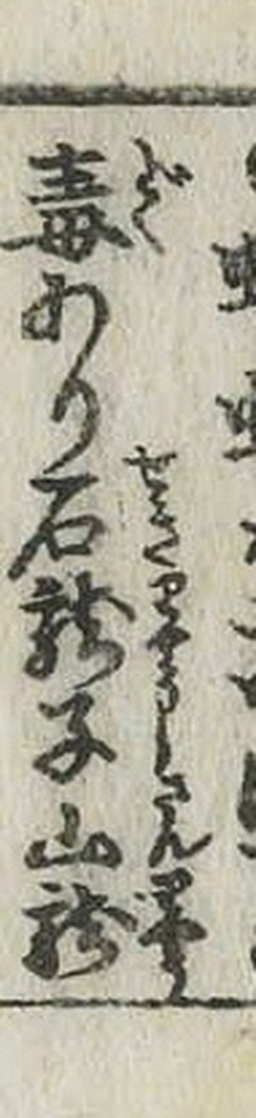毒あり石龍子山龍

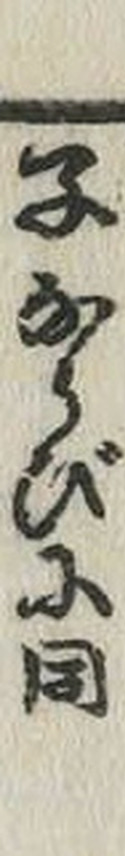子ならびに同
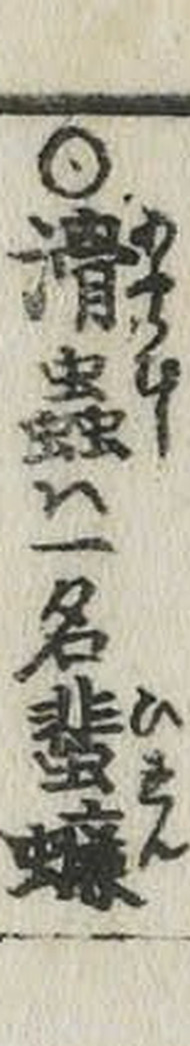○滑虫は一名蜚蠊
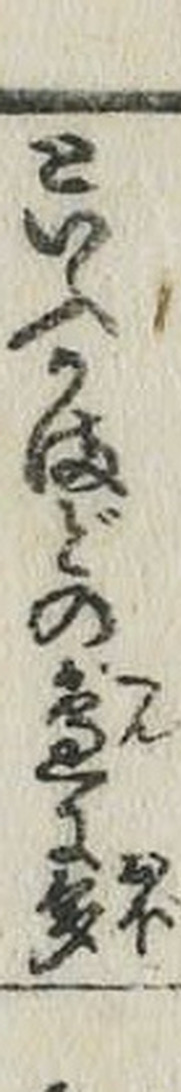といふかまどの辺に多
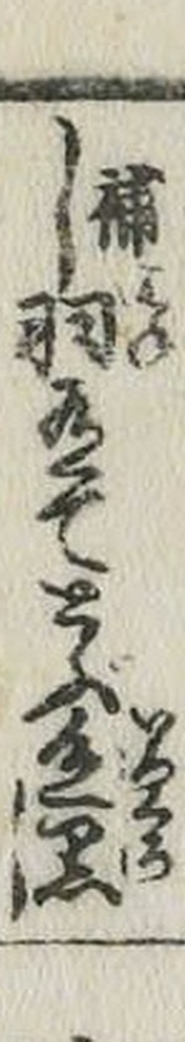し羽有てとぶ色黒し
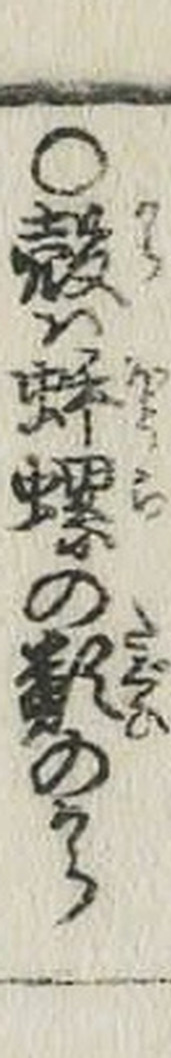○殻は蚌螺の類のから
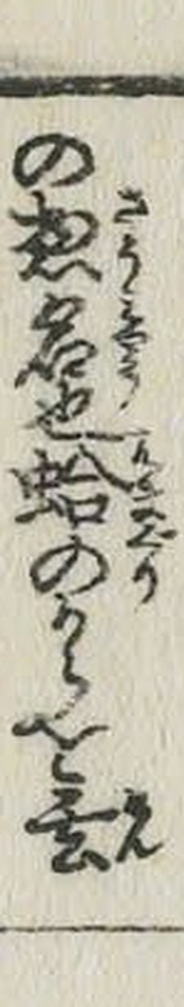の惣名也蛤のからを玄
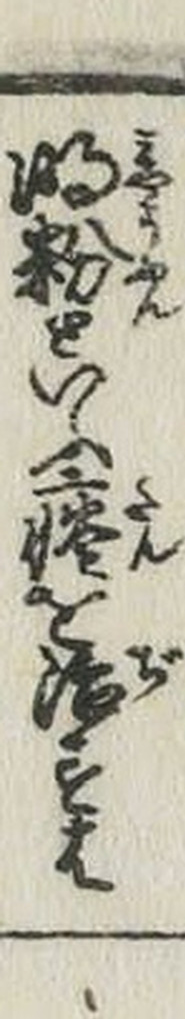明粉といふ痰を治すは
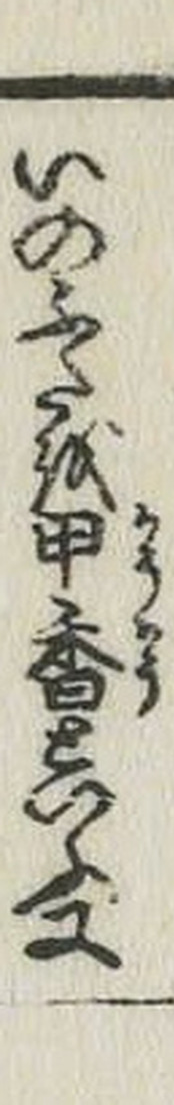いのふたを甲香といふ又
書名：増補頭書訓蒙図彙大成 10巻 7:巻之14-16
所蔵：東京学芸大学教育コンテンツアーカイブ
